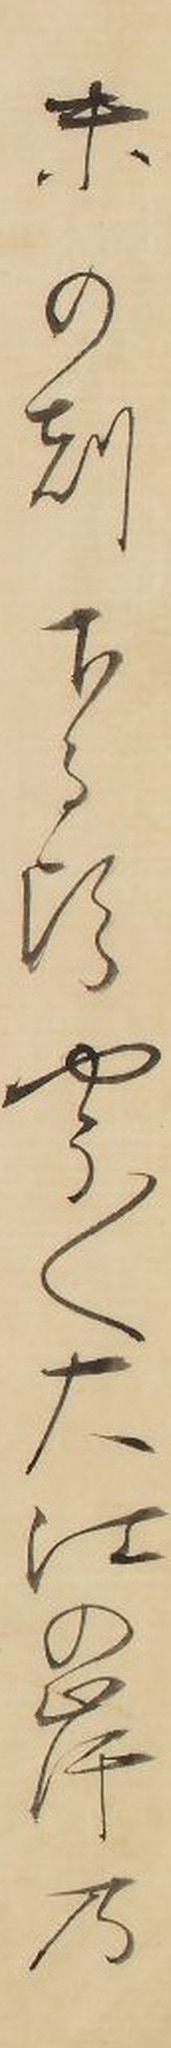未の刻下る頃やう〳〵大江の岸の
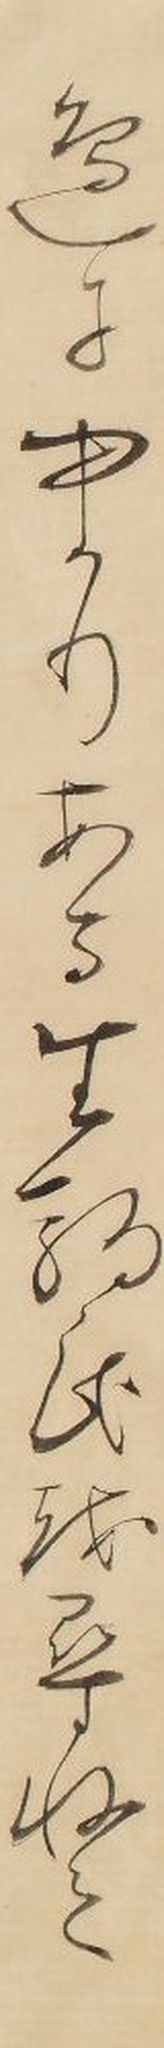辺にゆかりある生駒氏を尋ねて
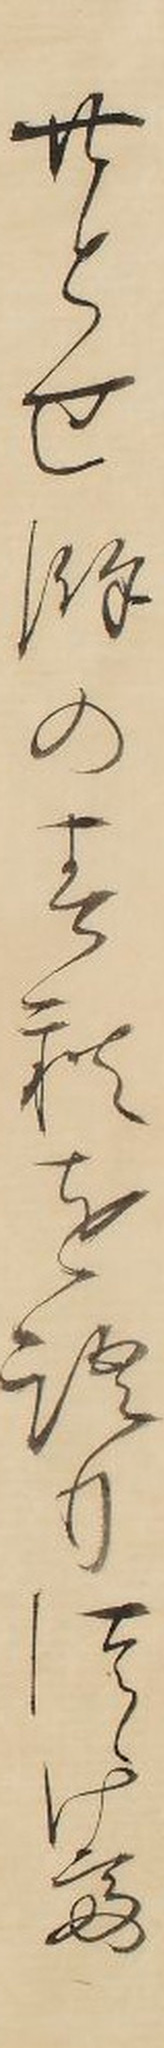廿とせ余の春秋を語りつゝけて
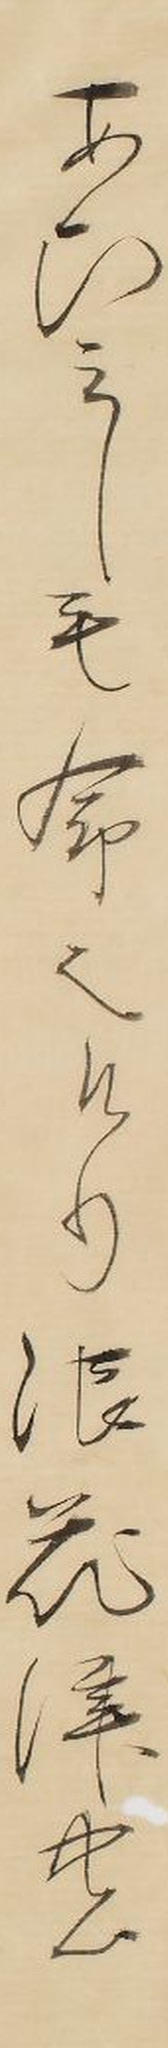あひみしも命也けり浪花津の
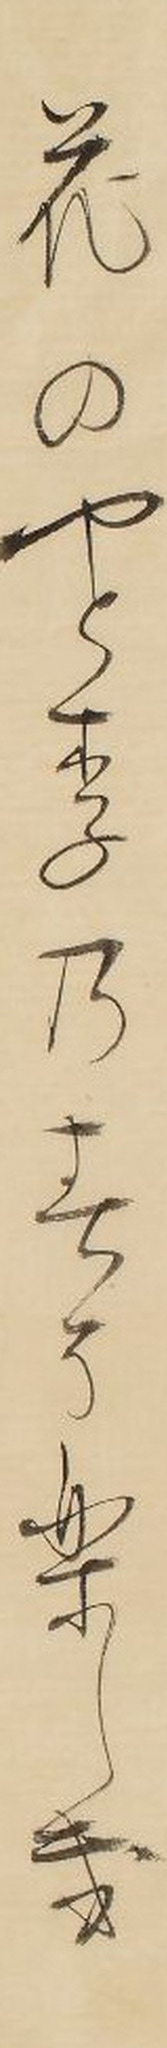花のやとりの春そ楽しき
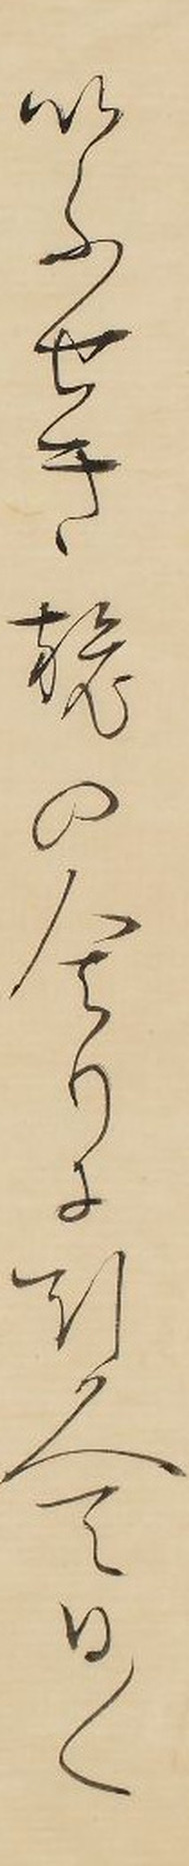いふせき旅の舎りに引かへて日〳〵
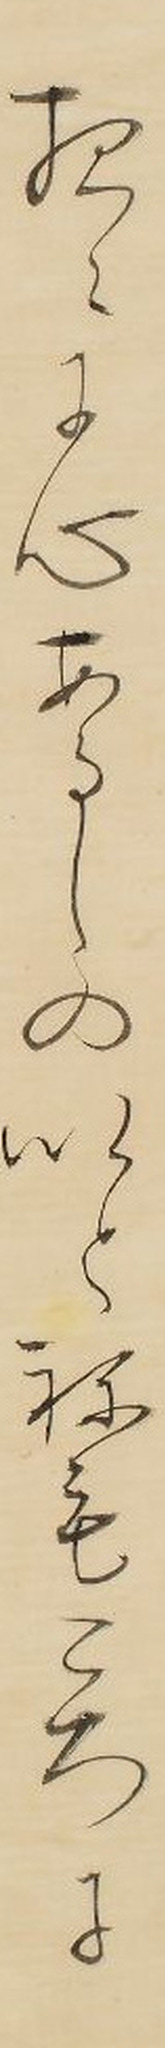夜々に心あるしのいとねもころに
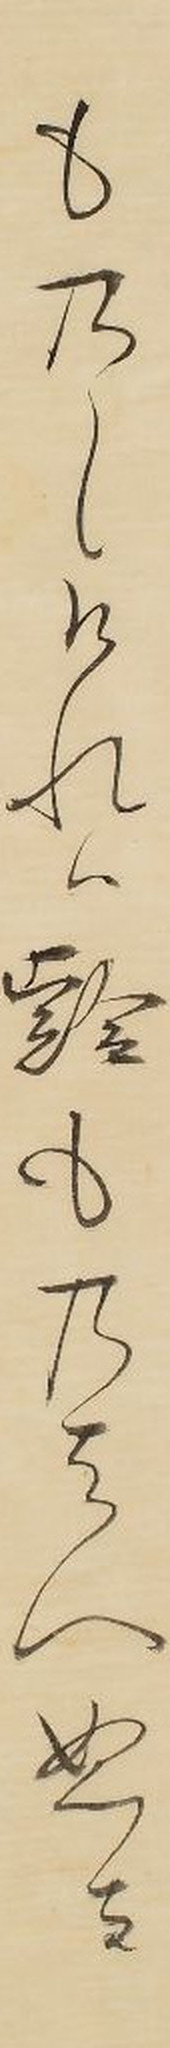ものしけれは齢ものはえぬる
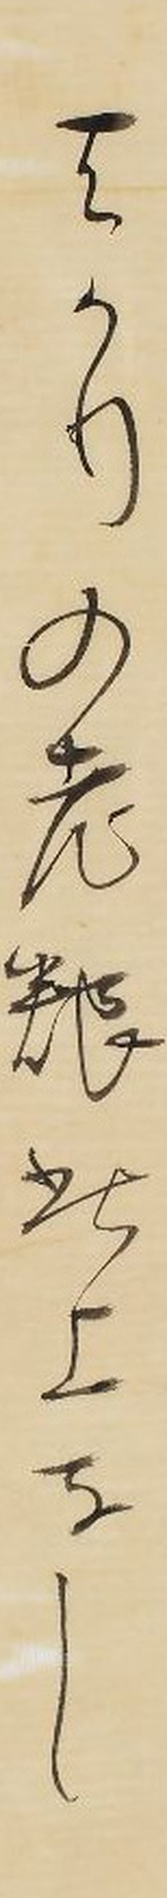はかりの老艱此上なし
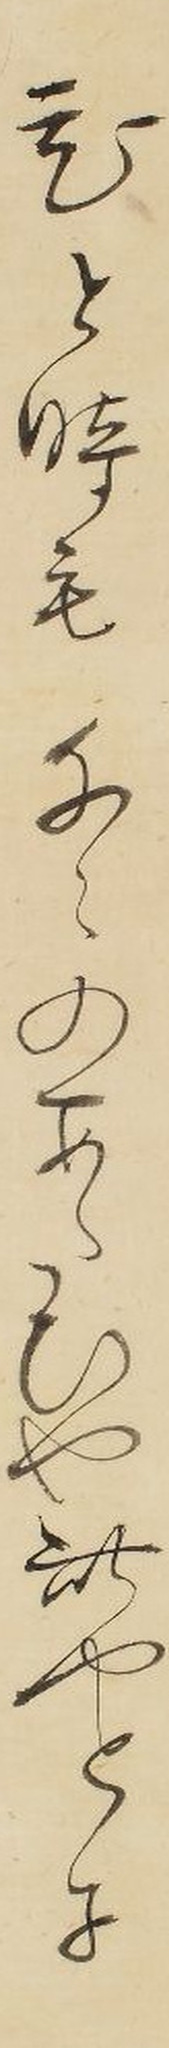ひと時も千々のあたひや此やとに
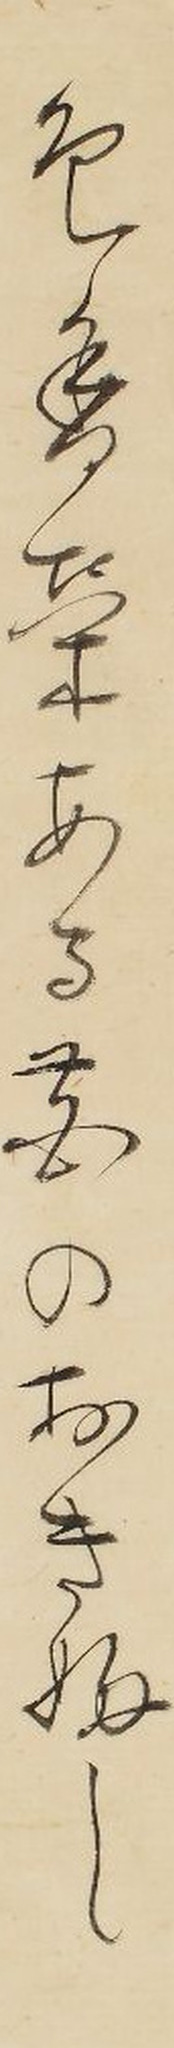色香栄ある花のおきふし
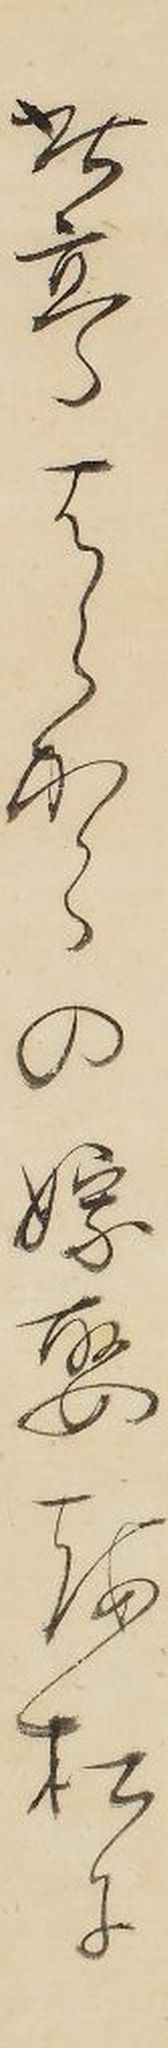此亭はらからの嫁娶を松に
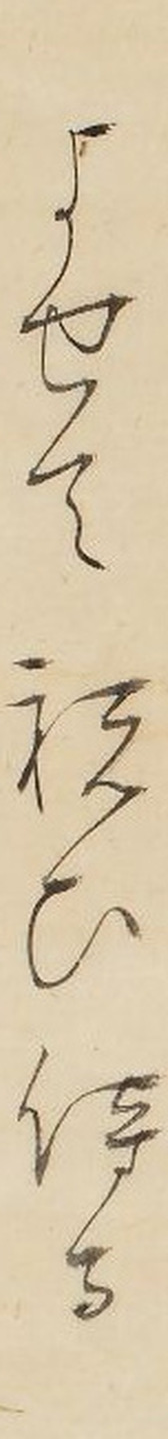よせて祝ひ侍る
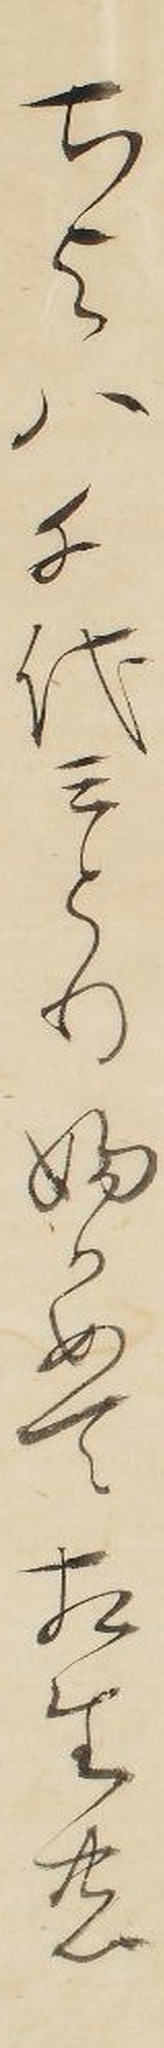ちよ八千代みとりふかめて相生の
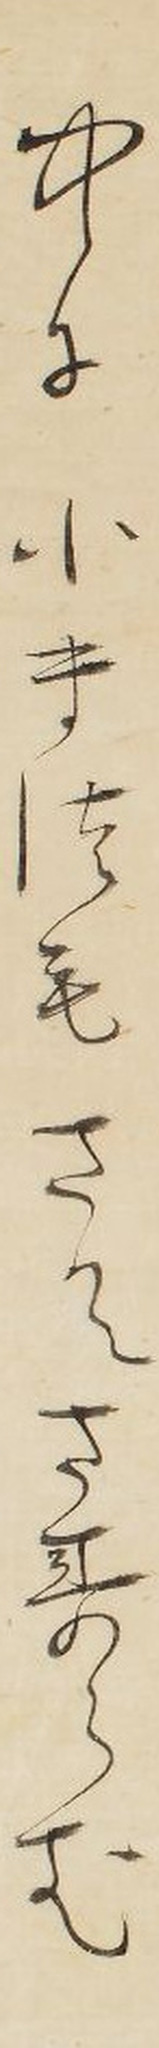中に小まつもさかえさすらむ
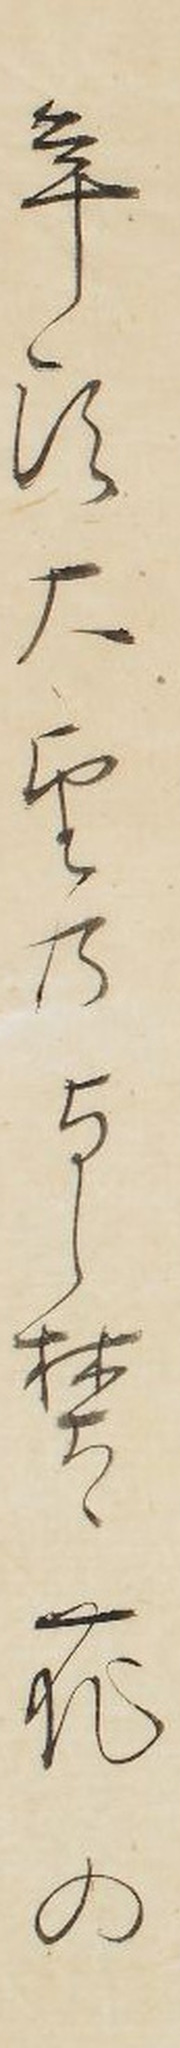年頃大望のよしのゝ花の
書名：花土産
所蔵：徳島県立図書館
